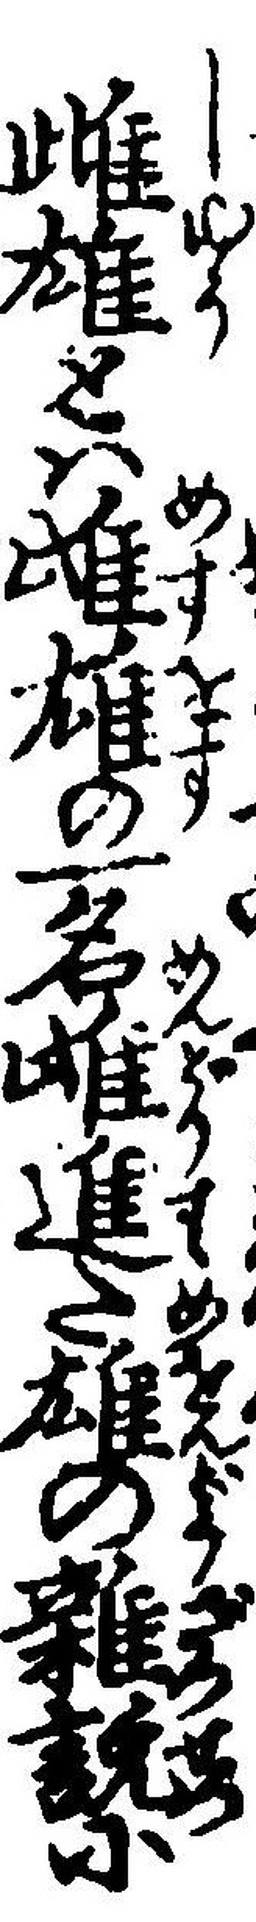雌雄とは雌雄の一名雌進た雄の雑説に
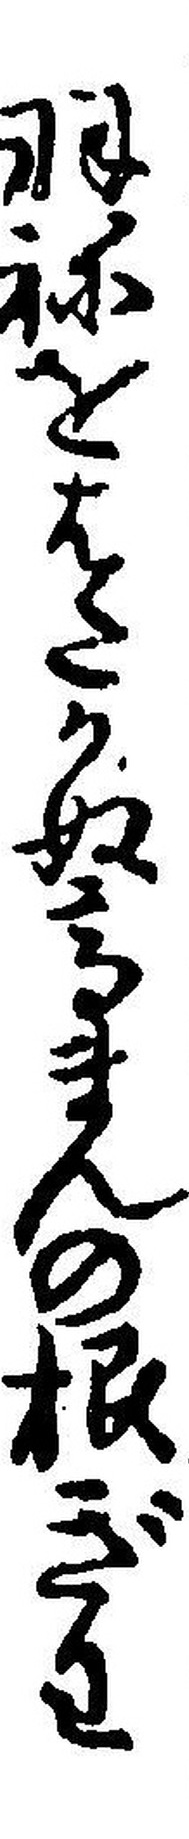羽ねをはたかぬ高まんの根ぎわ
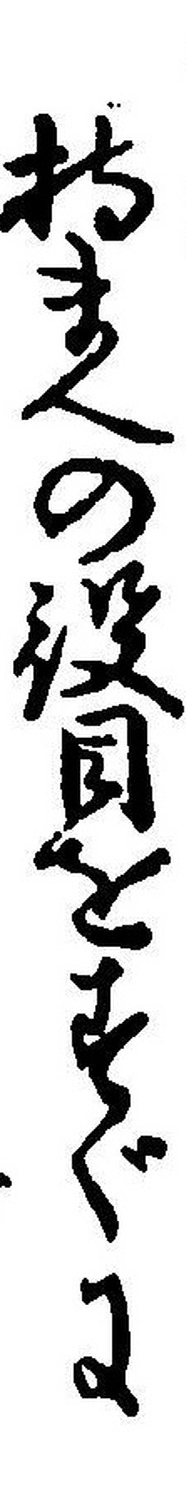持まへの役目をすぐに
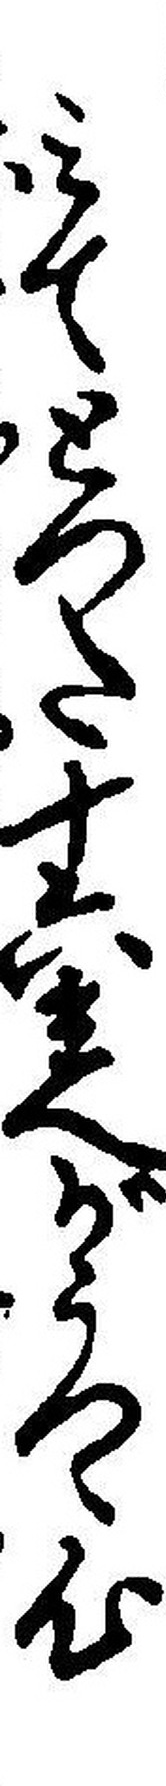みてとつた十六兵衛がうつゝ心
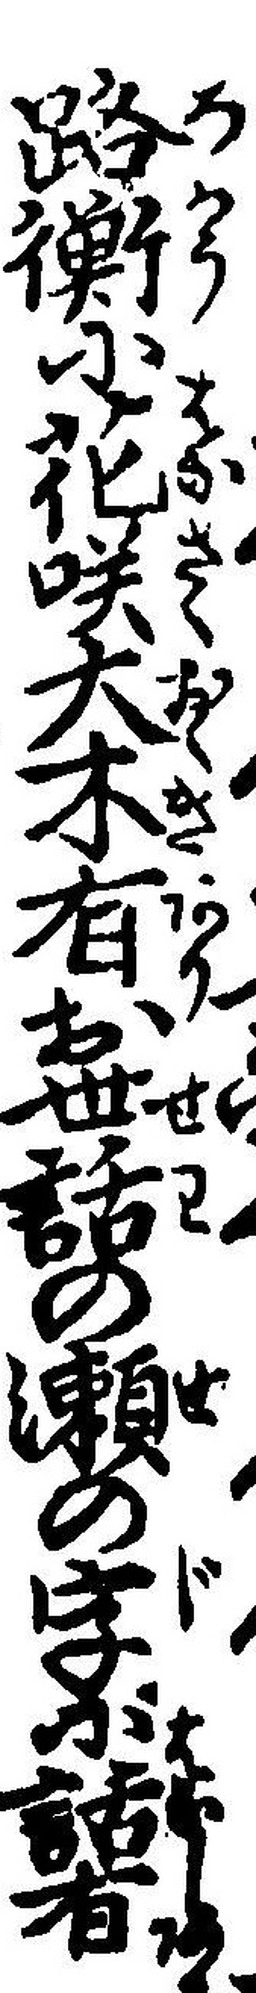路衡に花咲大木有お世話の瀬の字に話有
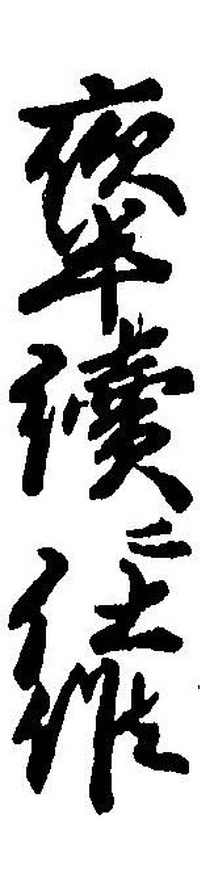夜半続仕候
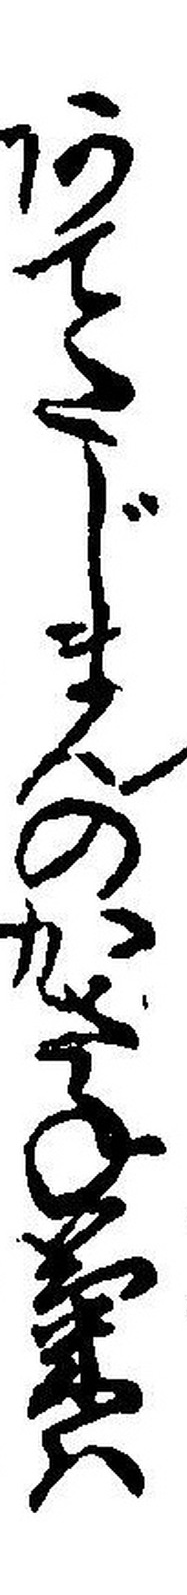あてたじまんのかさね菊は
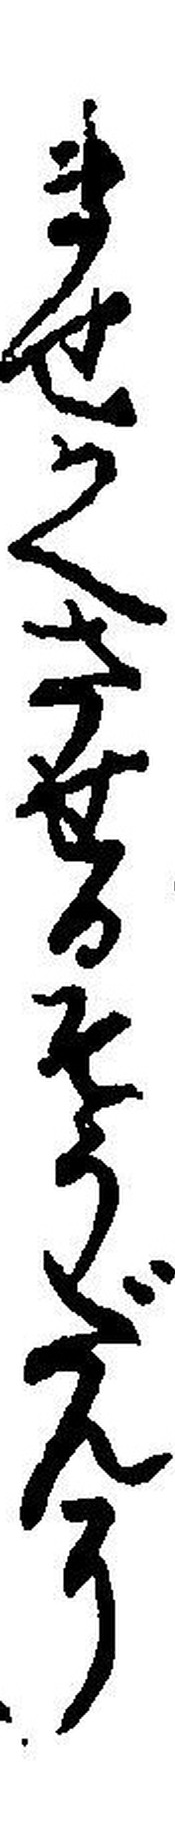ませかへさせるそうだんに
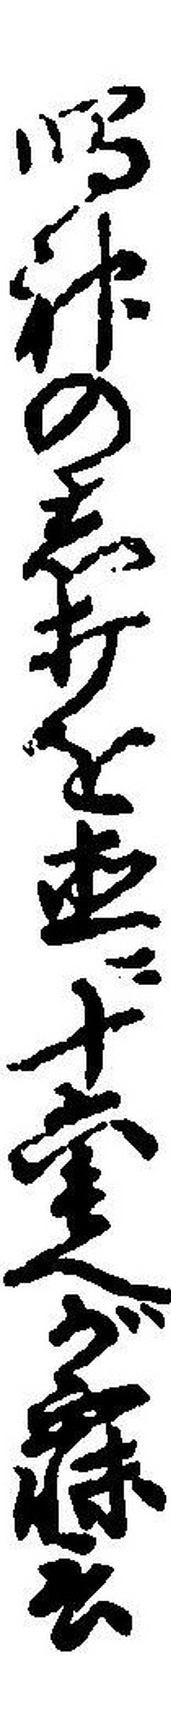鳴神のし打を直十六兵衛が寝言

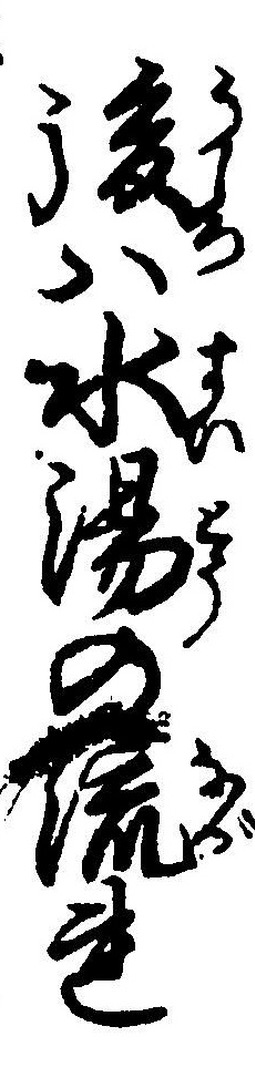後は水湯の流れ
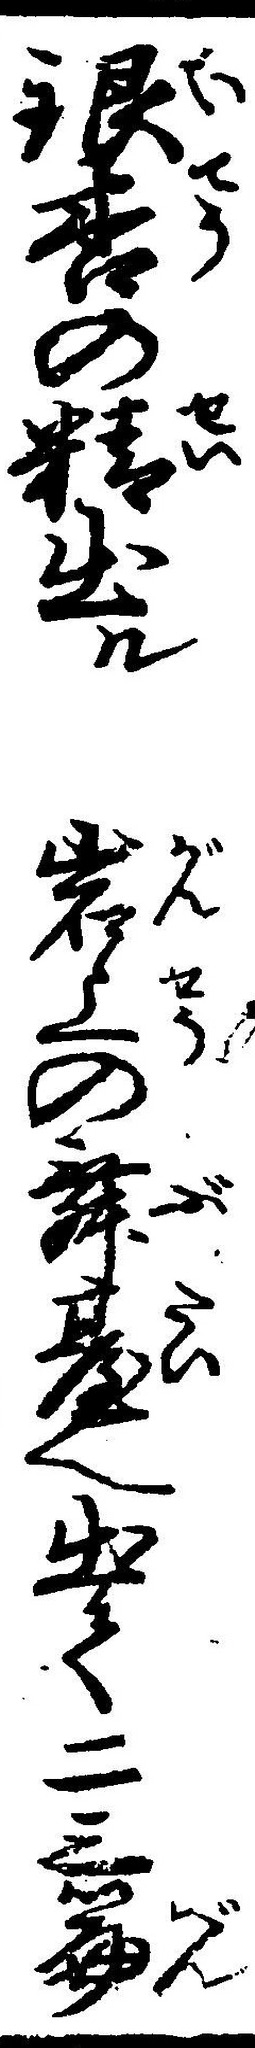銀杏の精出岩上の舞台へ出て二三篇
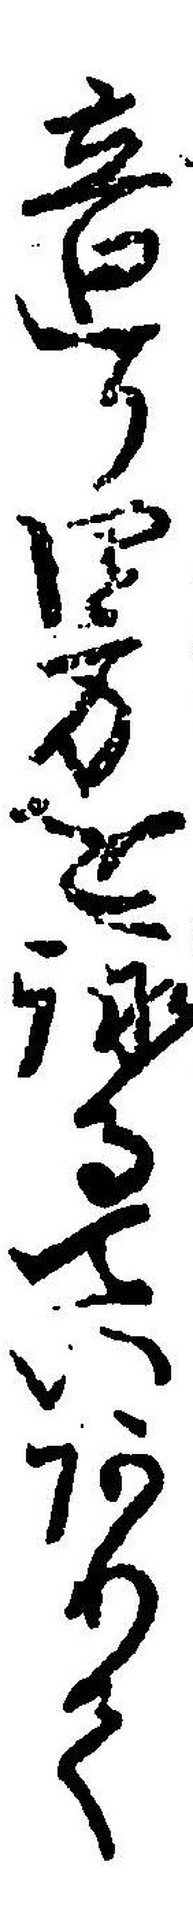立廻り四方を流るていありて
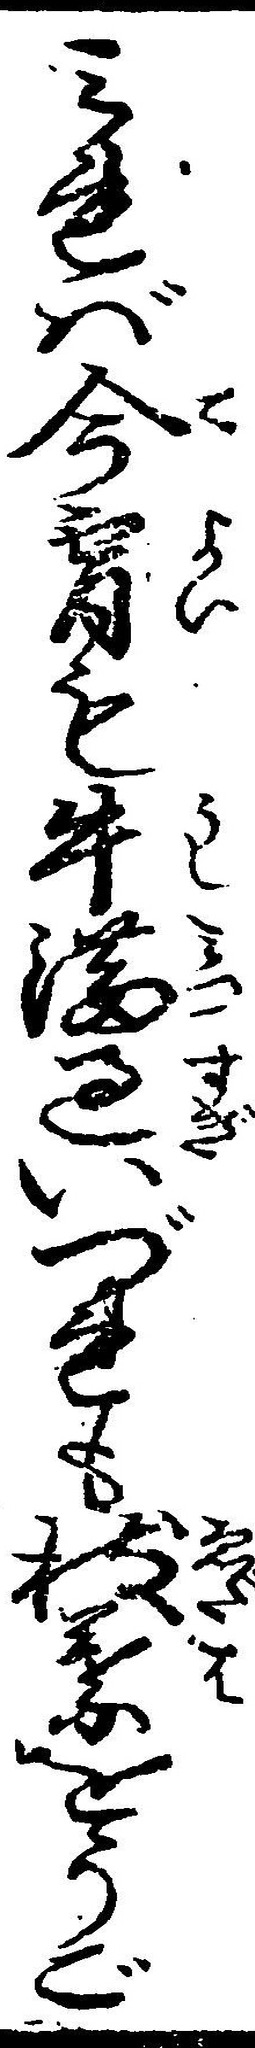みれば今宵も牛満過いづれも枝葉をうご
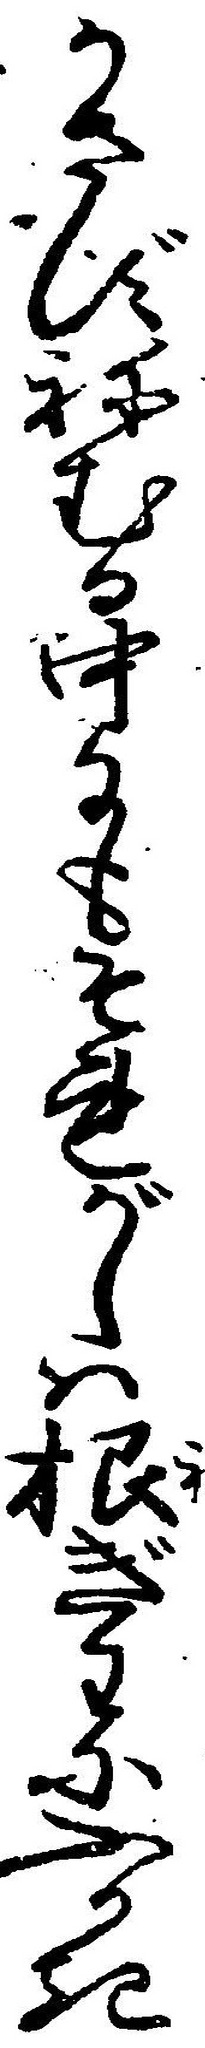かさずねむる中にもそれがしは根ぎわにふかき

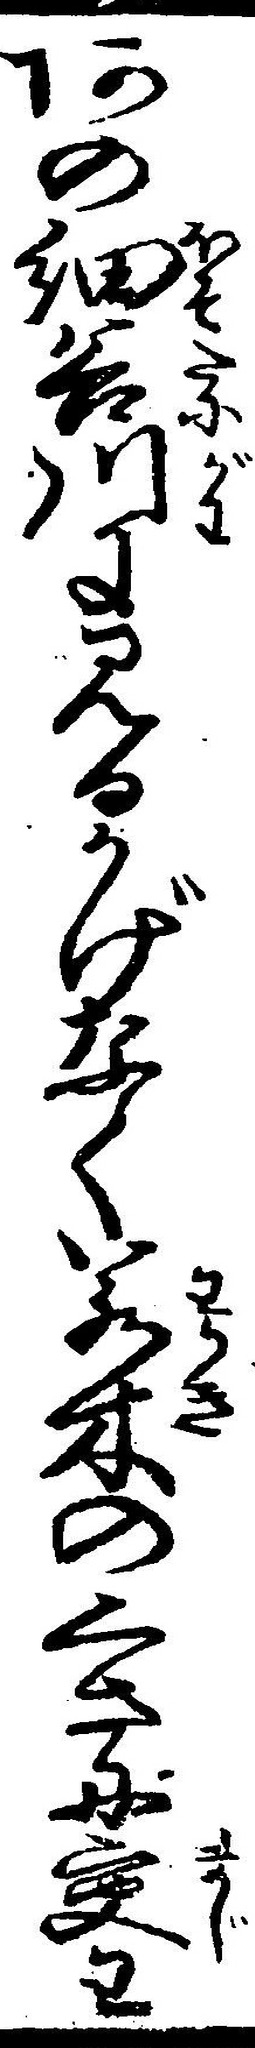あの細谷川に見るかげなく若木のくさに交わ
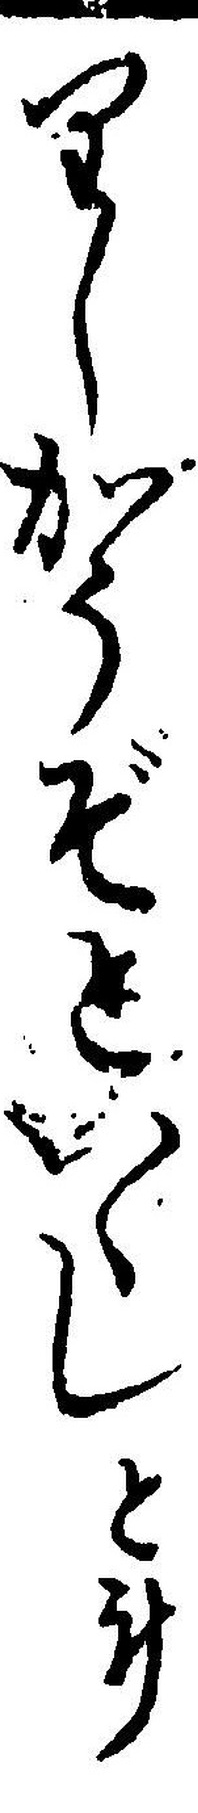りしかうぞといゝしと斗
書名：草木芝居化物退治 / 泉花堂三蝶(十六兵衛)作
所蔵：東京大学総合図書館 General Library in the University of Tokyo, JAPAN
